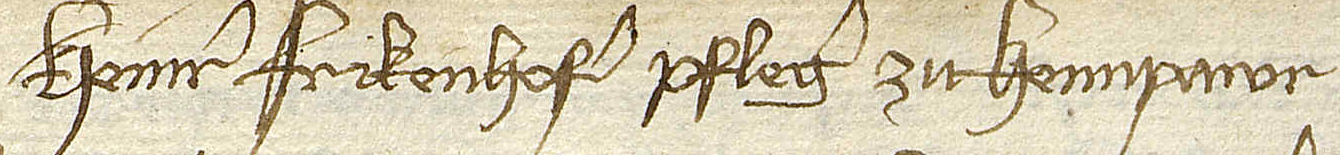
Heinr* Frikenhof* pfleg* ʒu Hennpawr
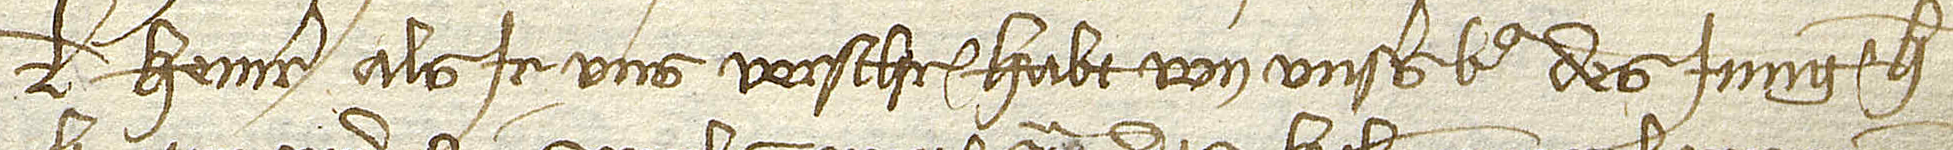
L* Heinr* als Ir vns verſchr* habt von vnſ*s b* des Iung* H*
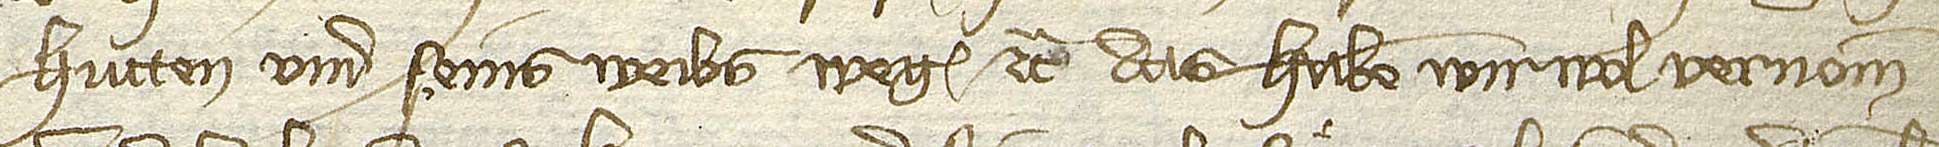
hutten vnd ſeins weibs weg* ec* das habe* wir wol vernom*
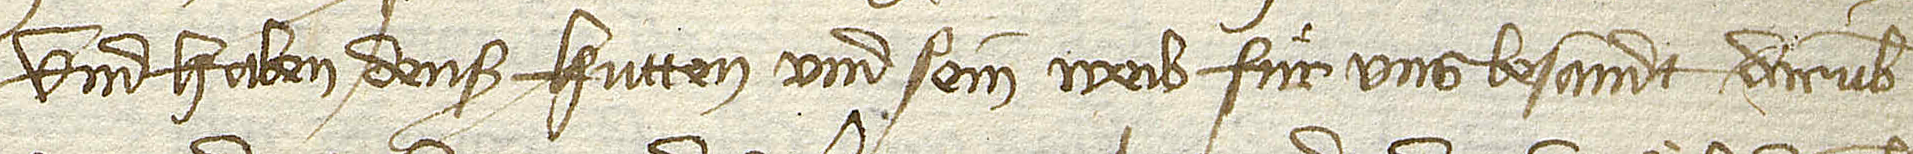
Vnd haben denſ* hutten vnd ſein weib für vns beſandt / daru*b
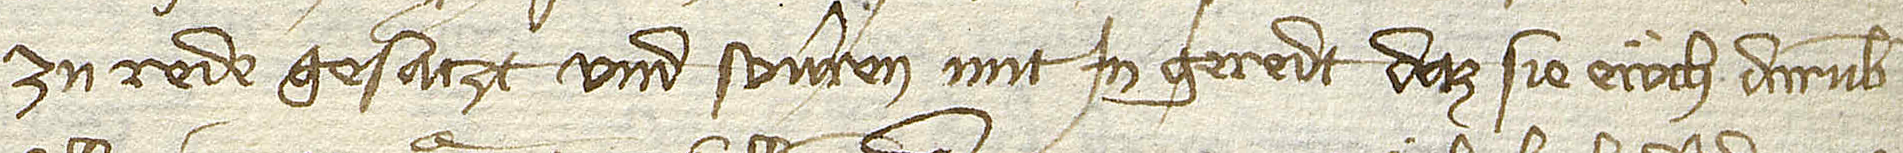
ʒu rede geſacʒt vnd ſou*ren mit In geredt daʒ ſie ewch daru*b
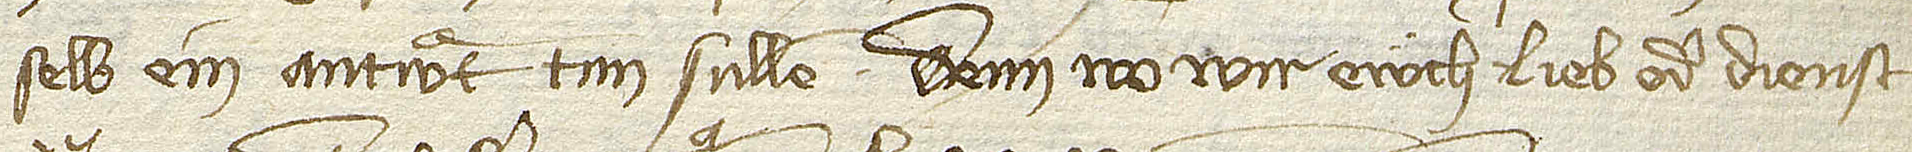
ſelb ein antw*t tun ſulle* . Denn wo wir ewch lieb od* dienſt
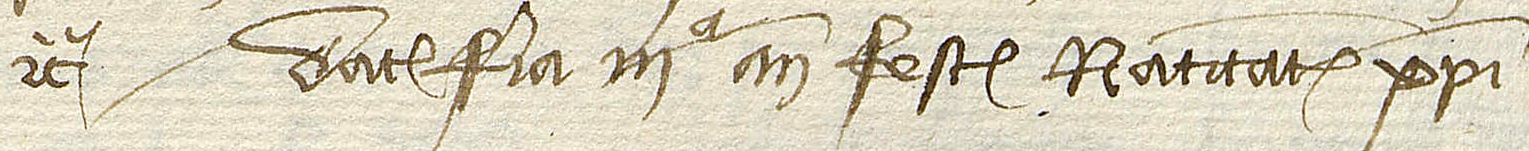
ec* / Dat fi*a iii* an* feſt* Natitat* xpi*
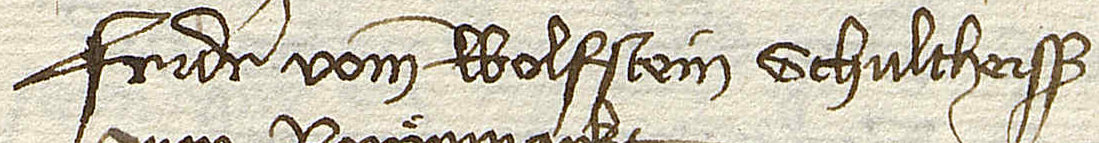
Fridr* vom Wolfſtein Schultheiſſ*
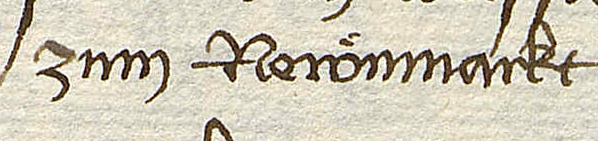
ʒum Newnmarkt
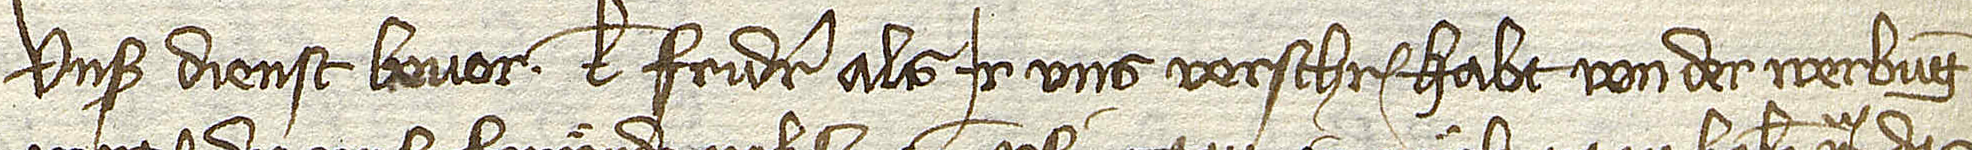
Vnſ* dienſt beuor . L* fridr* als Ir vns verſchr* habt von der werbu*g
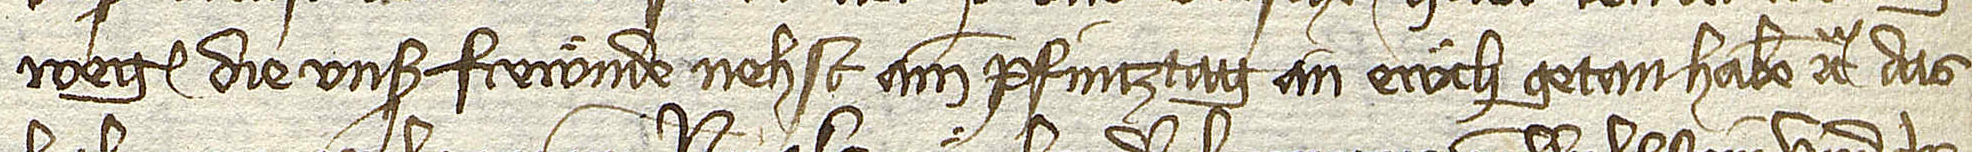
weg* die vnſ* frewnde nehſt am* Pfincʒtag an ewch getan habe* ec* das
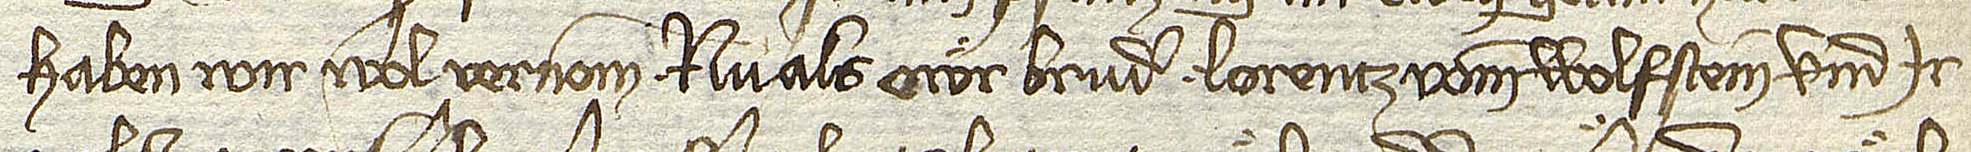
haben wir wol vernom* . Nu als ewr brud* ~ lorencʒ vom Wolfſtein Vnd Ir
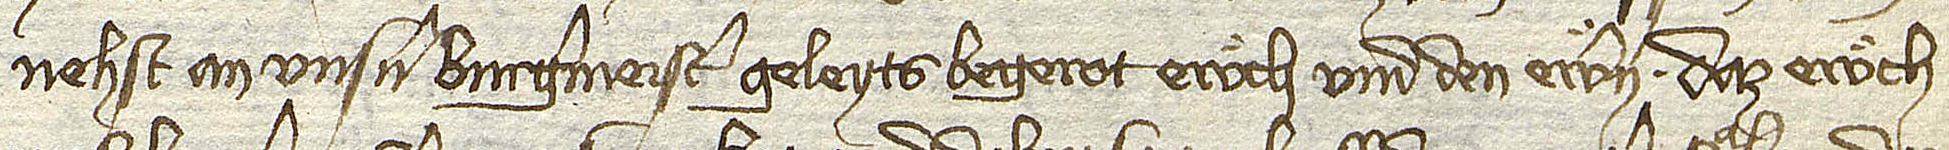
nehſt an vnſ*n Burgmeiſt* geleyts begeret ewch vnd ew*n . daʒ ewch
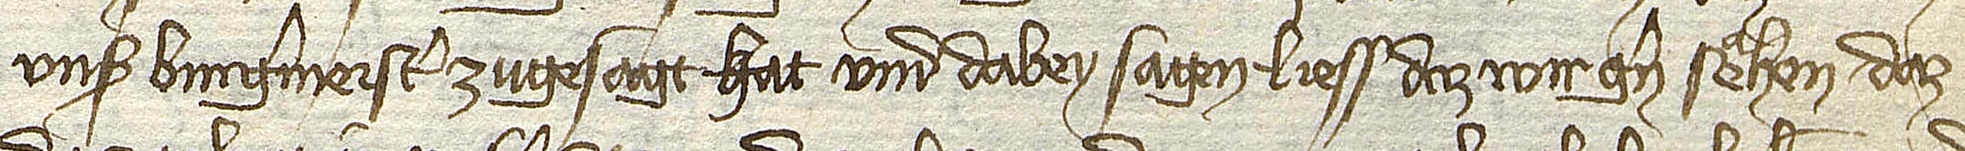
vnſ* burgmeiſt* ʒugeſagt hat vnd dabey ſagen lieſſ daʒ wir g*n ſëhen / daʒ
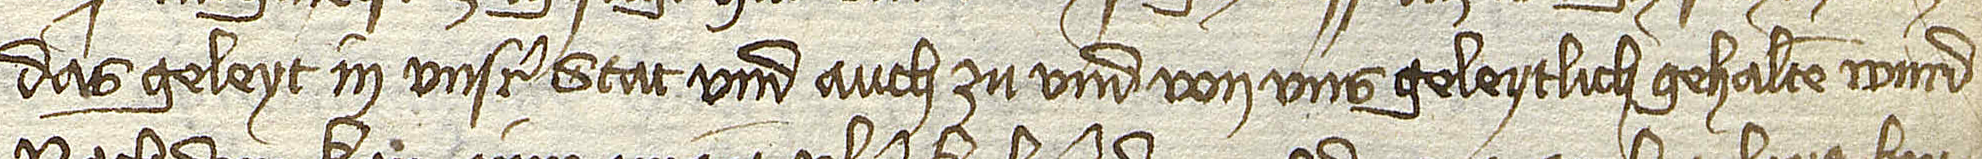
das geleyt in vnſ*r Stat vnd auch ʒu vnd von vns geleytlich gehalte* wurd
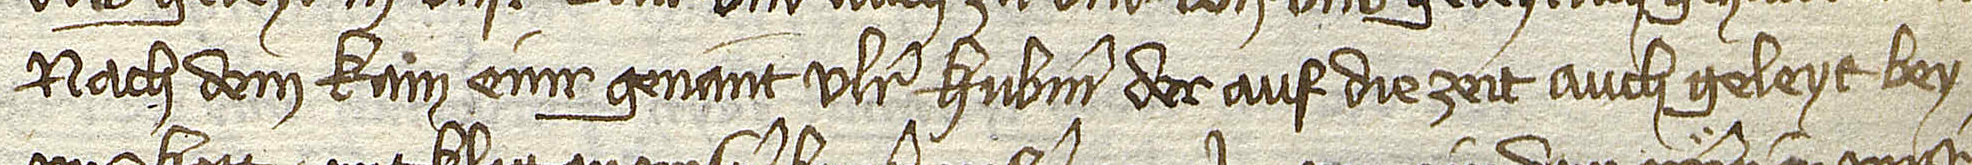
Nach dem kam einr genant* vlr* hubm* der auf die ʒeit auch geleyt bey
